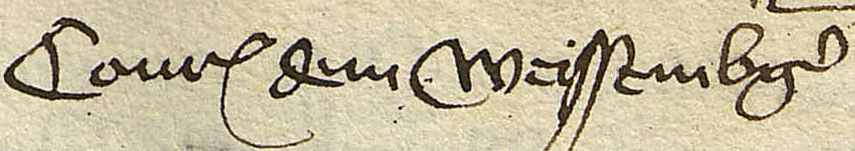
Conr* dem Weiſſemb*g*
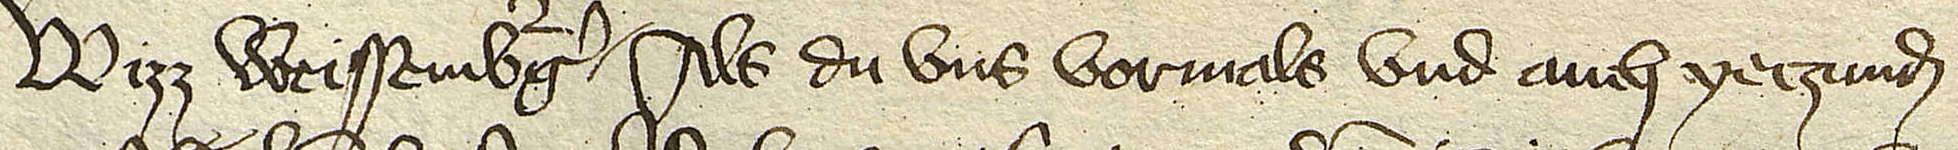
Wiʒʒ Weiſſembg* / Als du vns vormals vnd auch yecʒund*
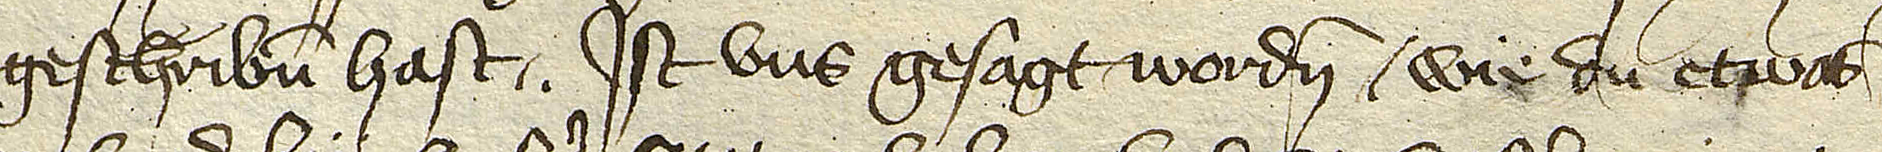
geſchribn* haſt / . Iſt vns geſagt wordn* / wie du etwas
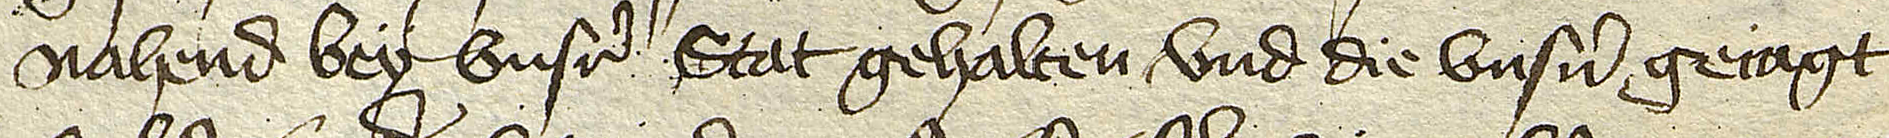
nahend bey vnſr* Stat gehalten / vnd die vnſn* geiagt
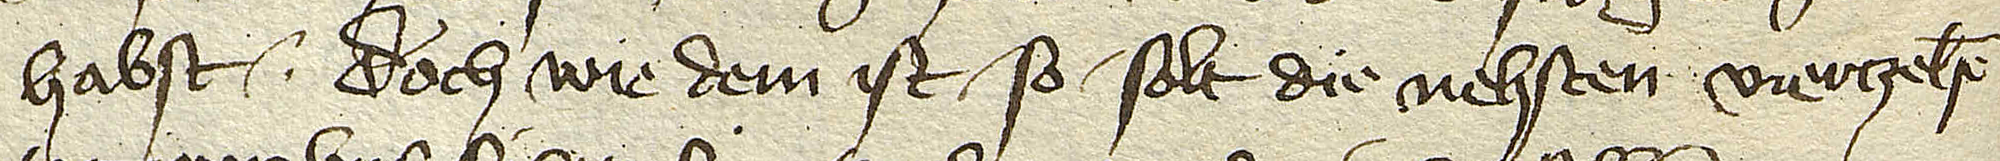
habſt / . Doch wie dem iſt / ſo / ſolt die nehſten viercʒehe*
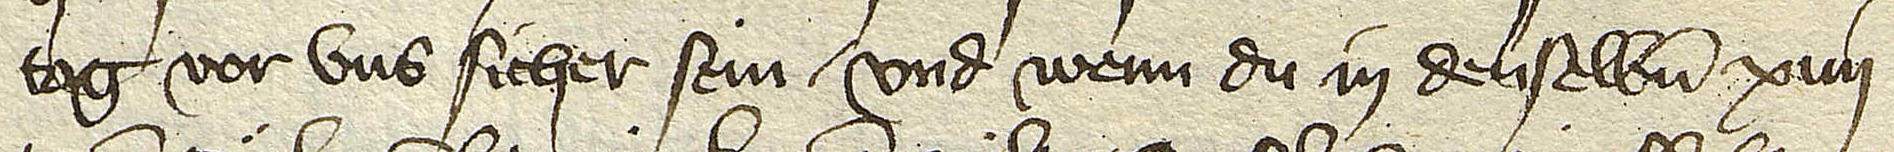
tag vor vns ſicher ſein / vnd wenn du in denſelbn* xiiii
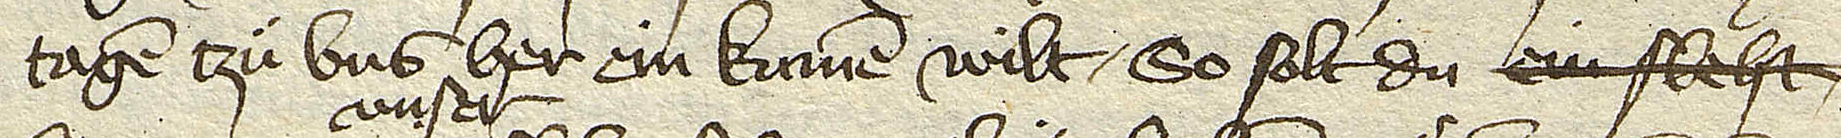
tage* cʒü vns her ein kume* wilt / So ſolt du ein ſleht
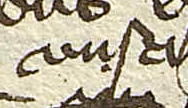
vnſer
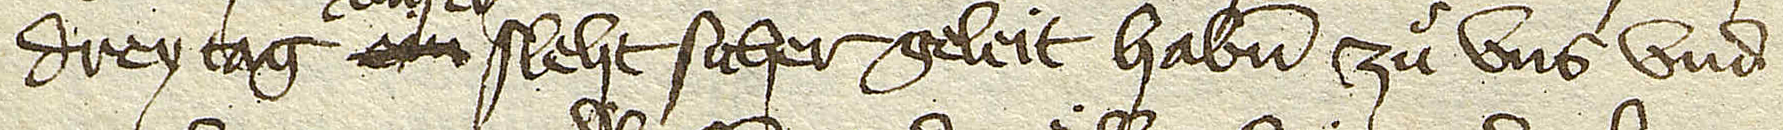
drey tag ein ſleht ſicher geleit habn* cʒü vns vnd
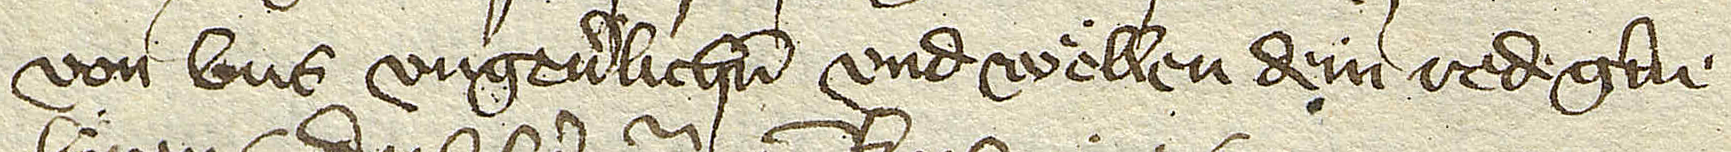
von vns vngeu*lichn* vnd wöllen dein rede g*ne
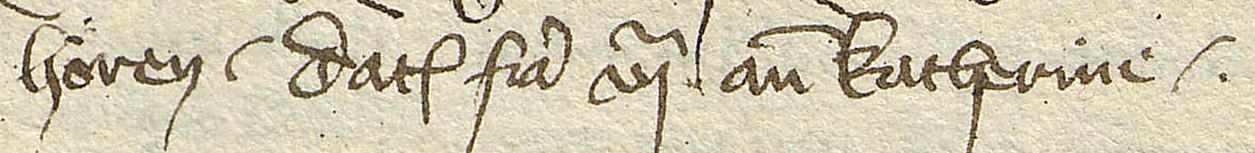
hören / Dat* fia* vi* an* Katherine / .
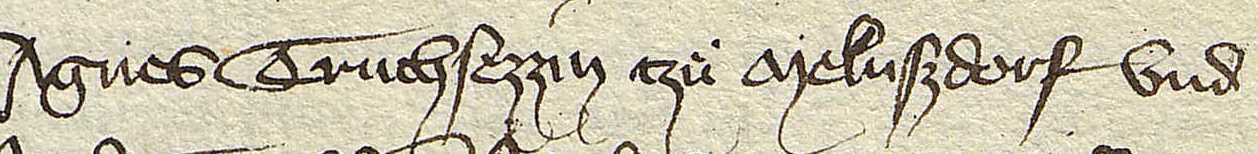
Agnes Truchſeʒʒin cʒü Melnſʒdorf vnd
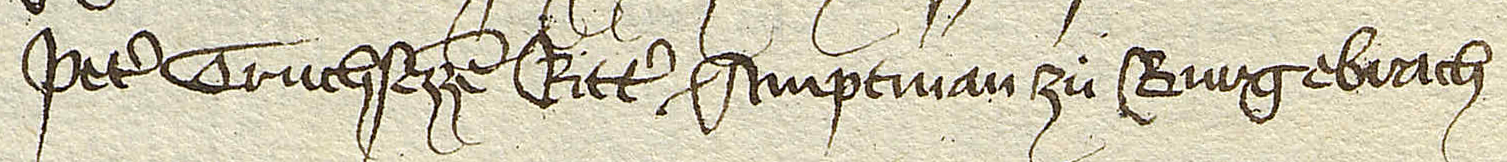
Pet* Truchſeʒʒe* Ritt* / Amptman cʒü Burgebrach
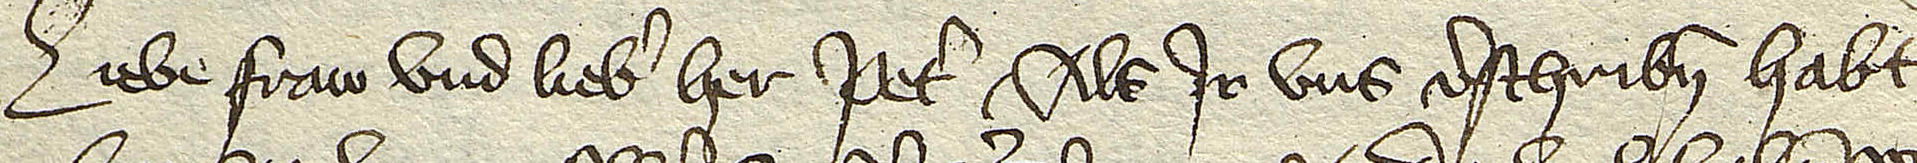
Liebe fraw vnd lieb* her Pet* / Als Ir vns v*ſchribn* habt
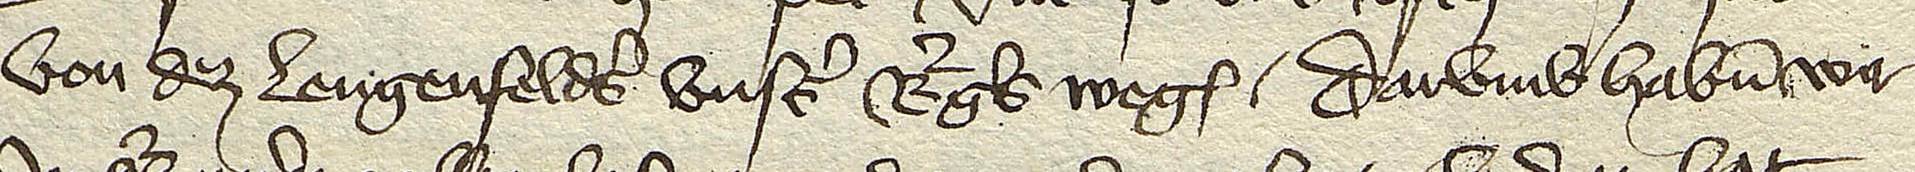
von deʒ Lengenfelds* vnſs* B*g*s weg* / Darvmb habn* wir
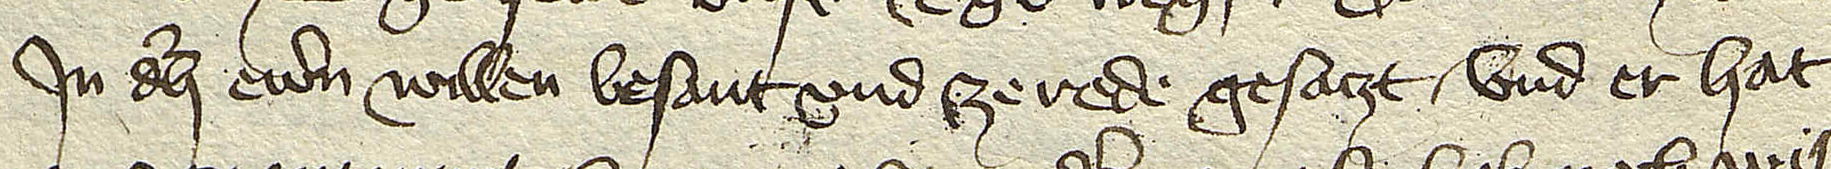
In d*h ew*n willen beſant vnd cʒe rede geſacʒt / vnd er hat
